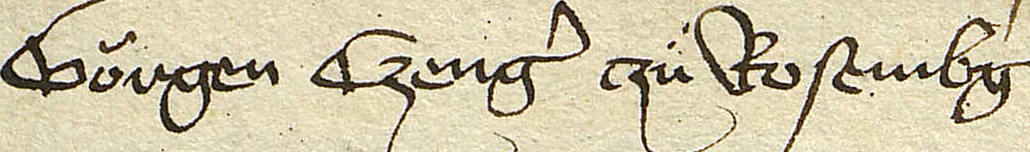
Görgen Cʒeng* cʒü Roſemb*g
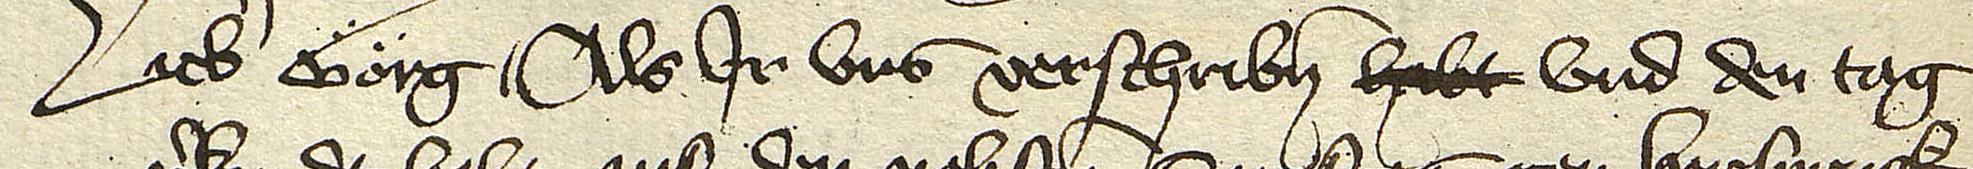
Lieb* Görg / Als Ir vns verſchribn* habt vnd den tag
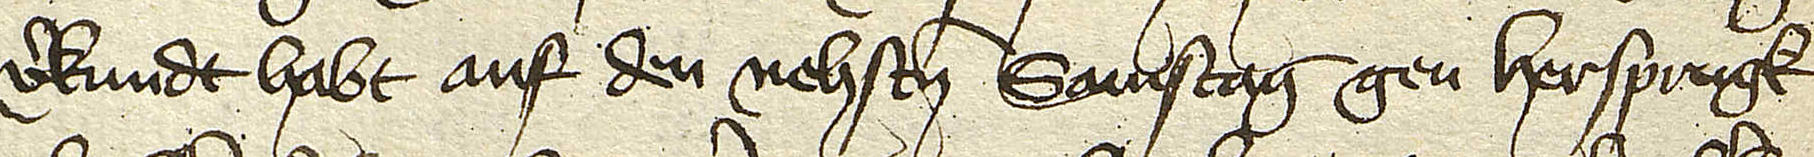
v*kundt habt auf den nehſtn* Samſtag gen Herſprugk
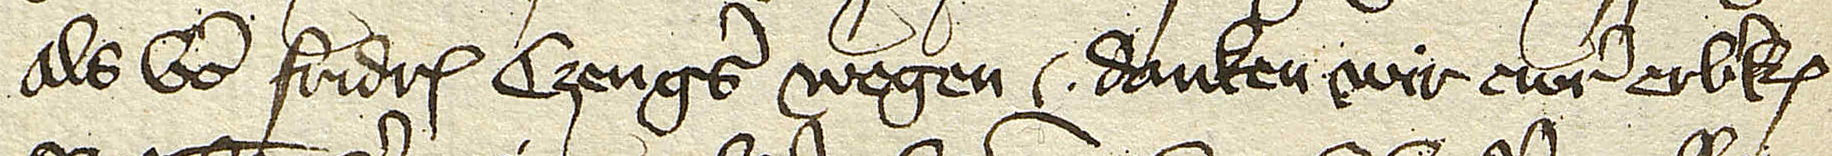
als vo* fridr* Cʒengs* wegen /. danken wir ewr* erb*k*
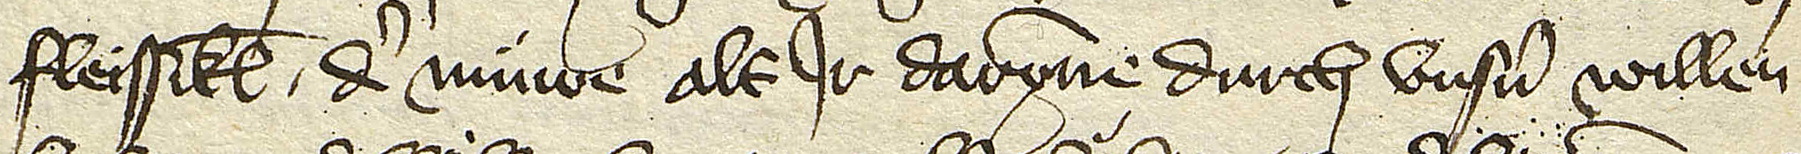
fleiſſikl* / d* müwe als Ir daryne* durch vnſn* willen
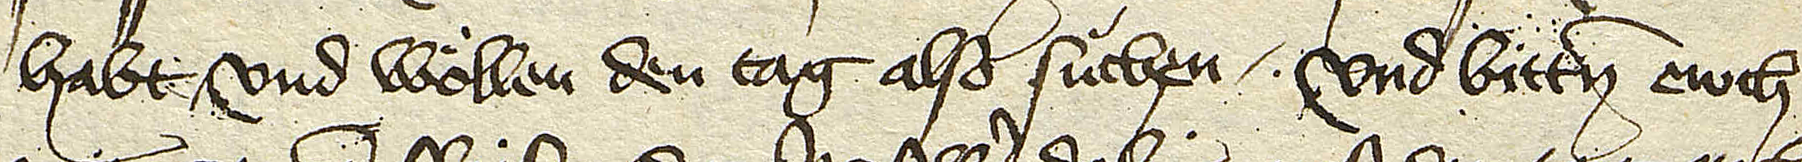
habt / vnd wöllen den tag alſo ſuchen / . vnd bittn* ewch
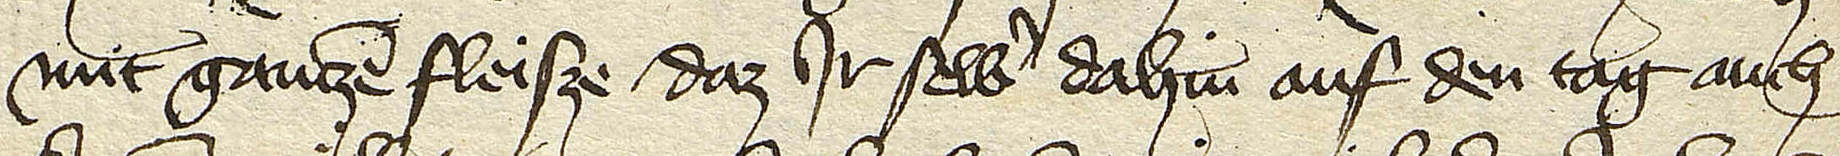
mit gancʒe* fleiſʒe / daʒ Ir ſelb* dahin auf den tag auch
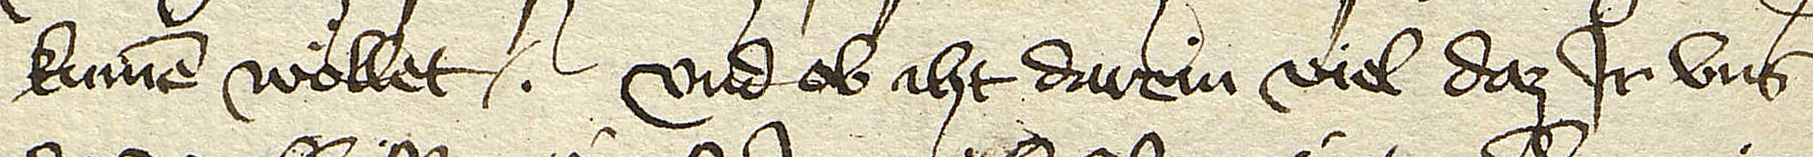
kume* wöllet / . vnd ob iht darein viel daʒ Ir vns
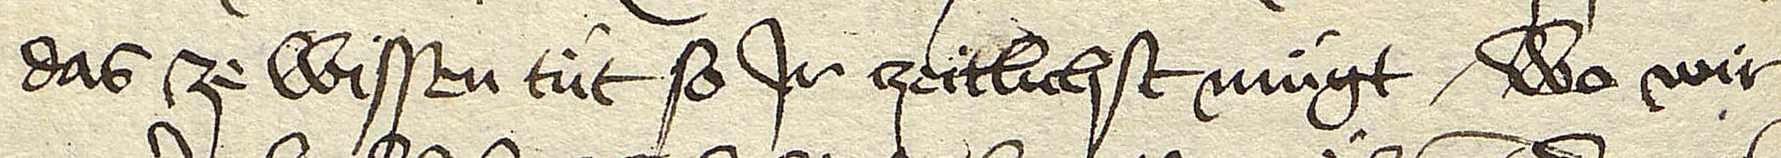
daʒ cʒe wiſſen tüt ſo Ir cʒeitlichſt mügt / wo wir
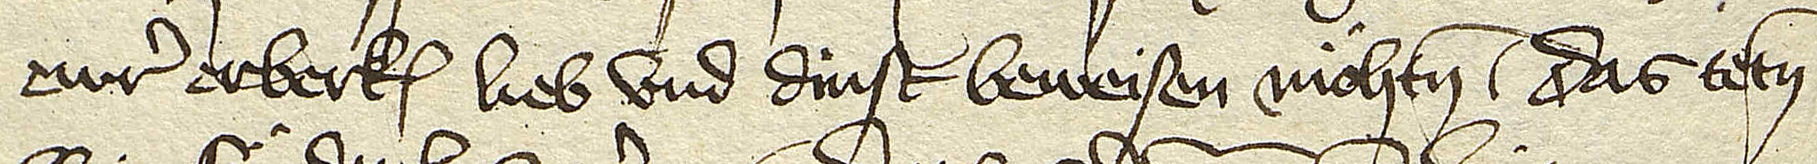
ewr* erberk* lieb vnd dinſt beweiſen möhtn* / Das tetn*
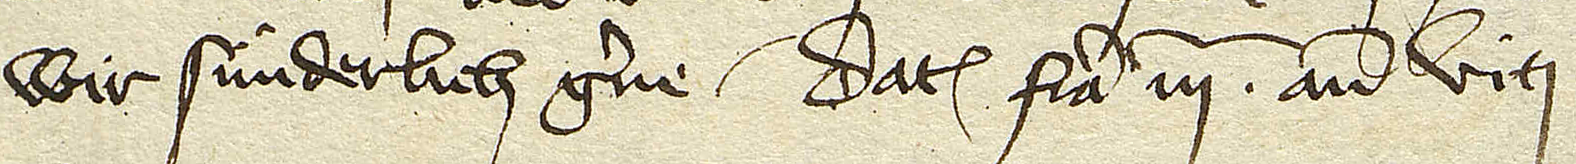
wir ſünderlich g*ne / Dat* fia* iii* . an* viti
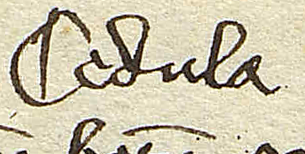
Cedula
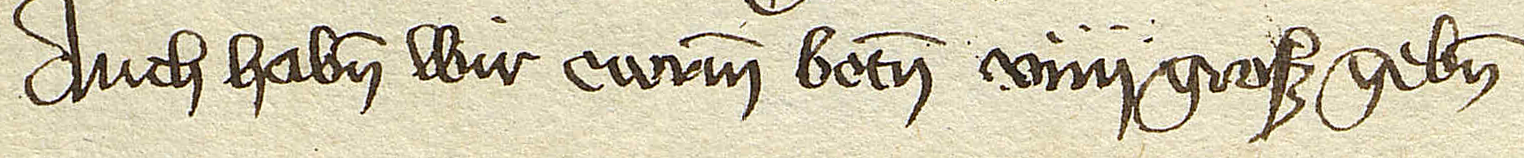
Auch habn* wir ewrm* botn* viiii groſʒ gebn*
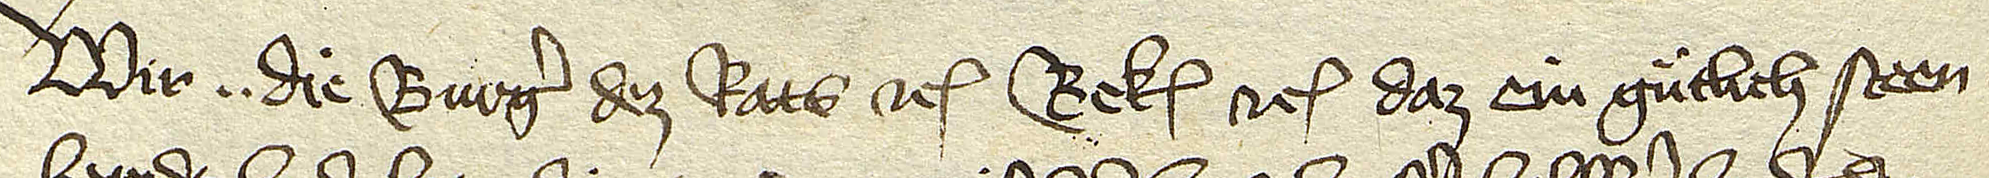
Wir .. die Burg* deʒ Rats ec* Bek* ec* daʒ ein gütlich ſteen
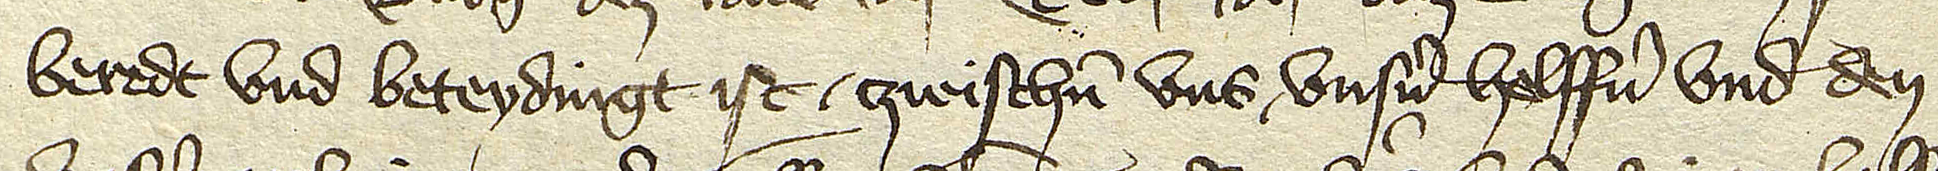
beredt vnd beteydingt iſt / cʒwiſchn* vns / vnſn* helffn* vnd den
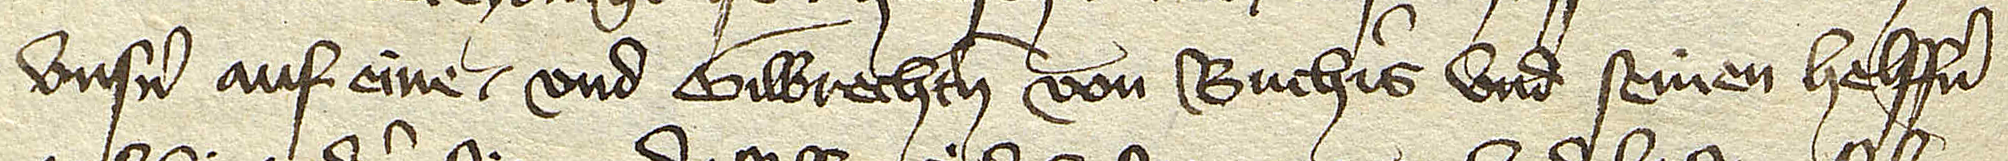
vnſn* auf eine / vnd Gilbrechtn* von Buchis* vnd ſeinen helffn*
